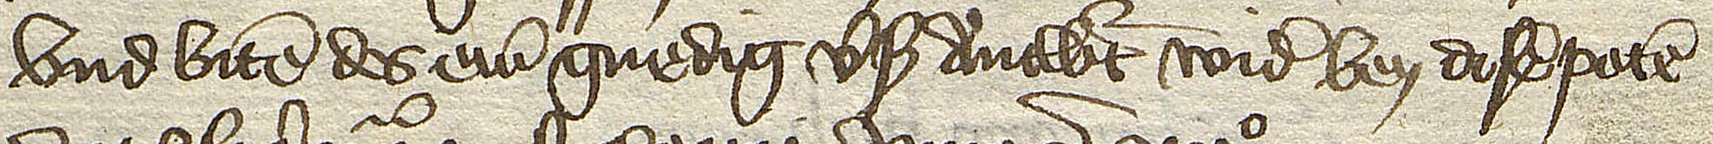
vnd bite* des ew* gnedig v*ſ* Ant*t wid* bey diſe* pote*
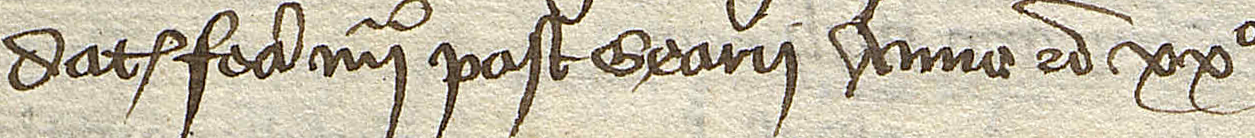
Dat* fea* iiii* poſt Georii Anno ec* xx*
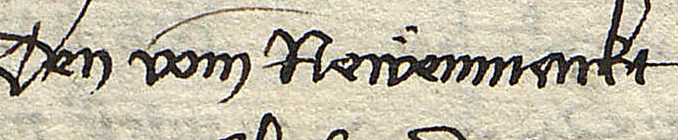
Den vom* Neẅenmarkt
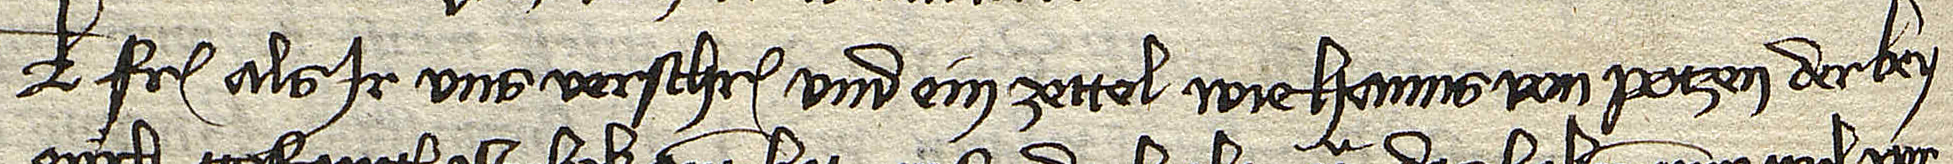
L* fr* als Ir vns verſchr* vnd ein ʒettel wie hanns von pocʒen der bey
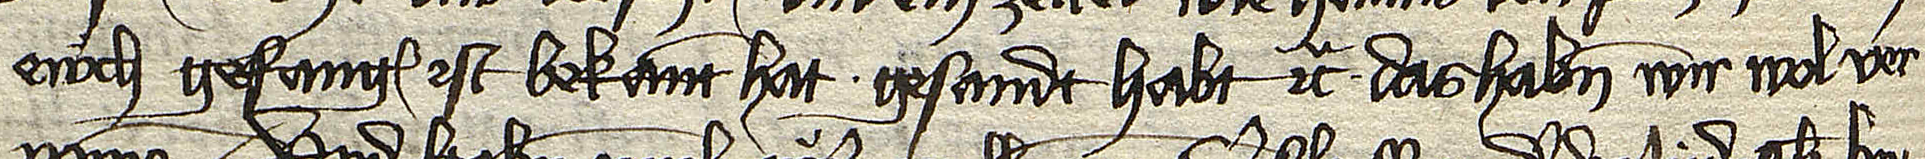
eẅch gefang* iſt bekan*t hat . geſanft habt ec* . das habn* wir wol ver
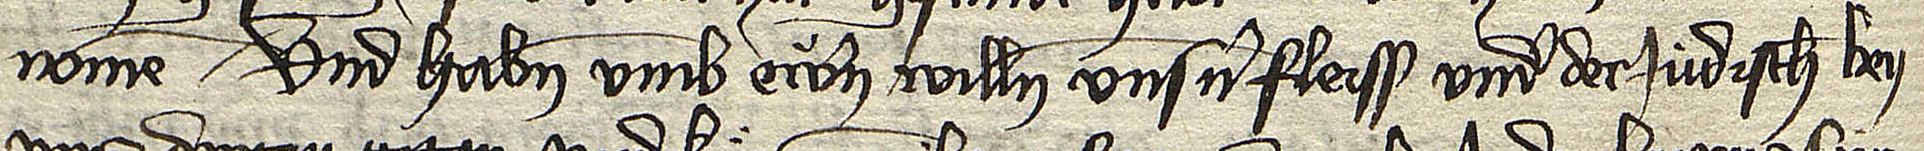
nome* / Vnd habn* vmb eẅ*n willn* vnſn* fleiſſ vnd* der Iüdiſch* bey
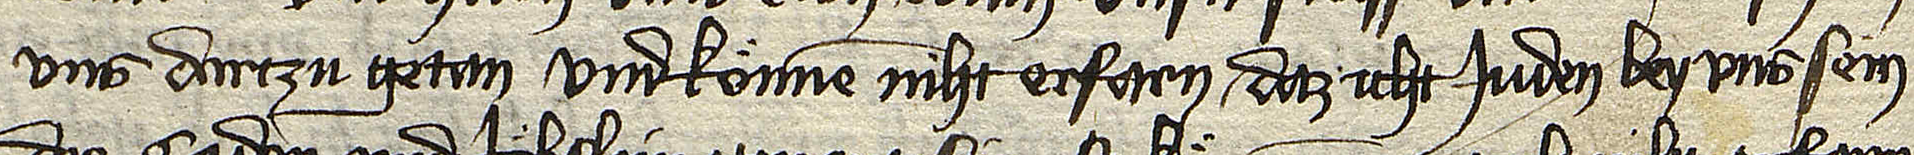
vns darcʒu getan vnd könne* niht erfarn / Daʒ icht Iuden bey vns ſein
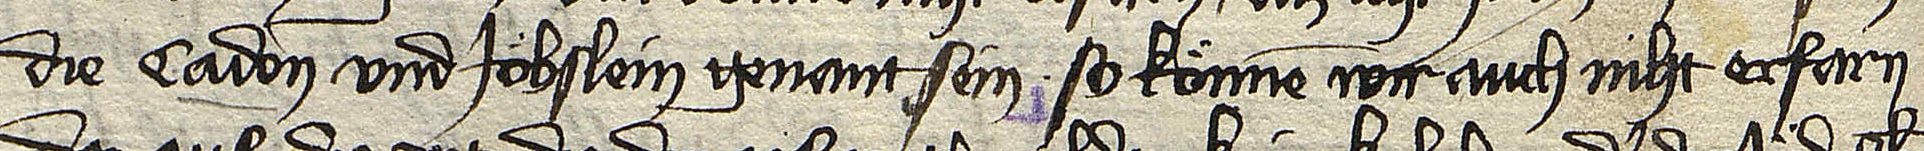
die Cadon vnd Iöbſlein genant ſein . ſo könne* wir auch niht erfarn
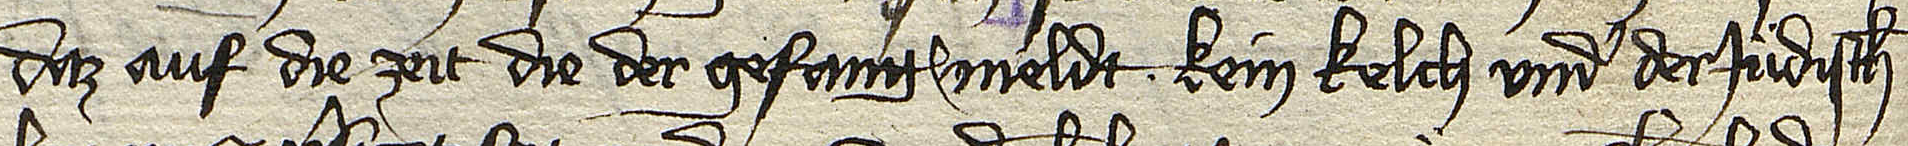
Daʒ auf die ʒeit die der gefang* meldt . kein kelch vnd* der Iüdiſch*
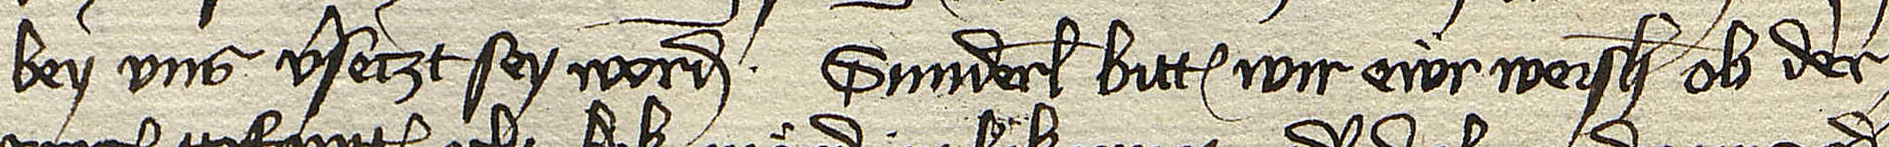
bey vns v*ſecʒt ſey word* . Sunderl* bitt* wir eẅr weiſh* ob der
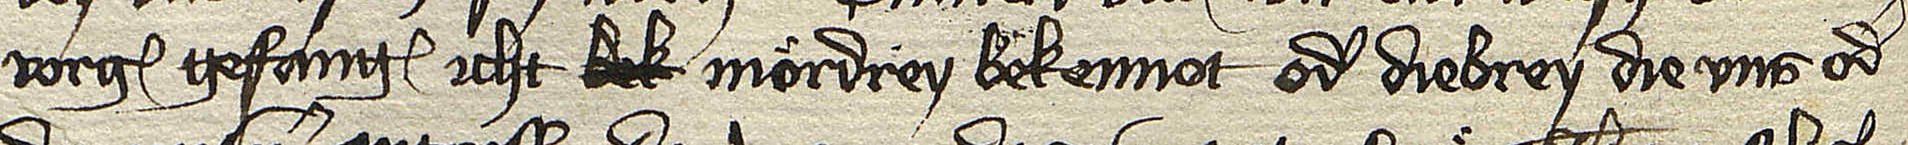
vorg* gefang* icht bek mördrey bekennet od* diebrey die vns od*
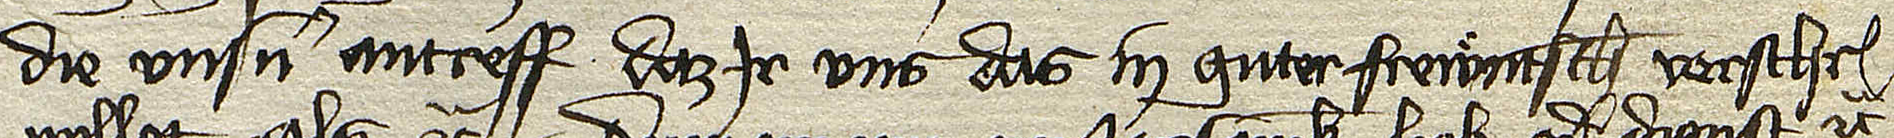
die vnſn* antreff . Daʒ Ir vns das in guter freẅntſch* verſchr*
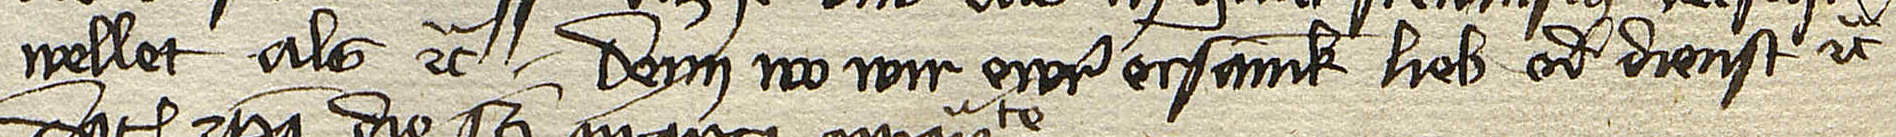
wellet als ec* / Denn wo wir ewr* erſamk* lieb od* dienſt ec*
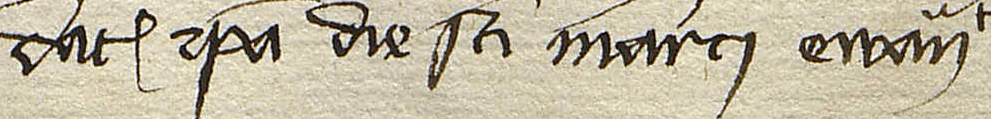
Dat* ipa* die ſci* marci ewan*
